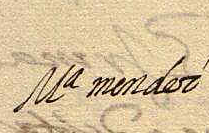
Ma mendez
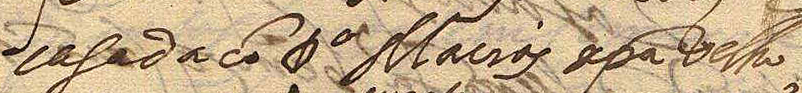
casada cō Do Macias xpā velho
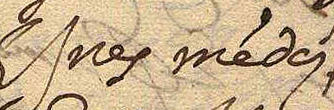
E Jnes mēdez
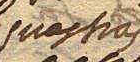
suas tias
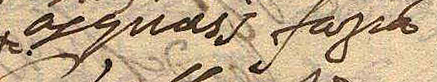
as quais faziaõ
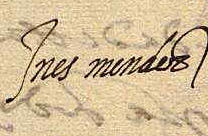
Jnes mendez
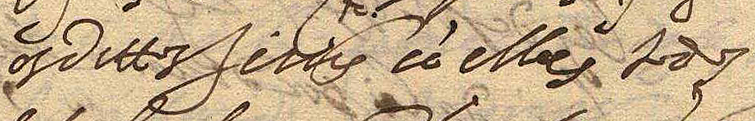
os dittos Jeius cō ellas todos
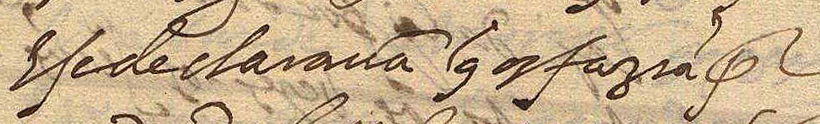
E se declarauā q̄ os faziā p̄
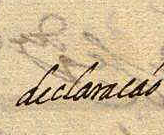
declaraçaõ
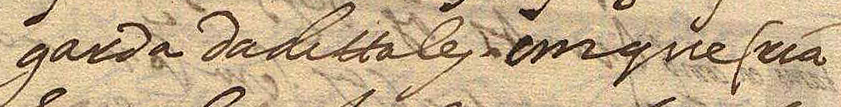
garda da ditta lej em que Criā
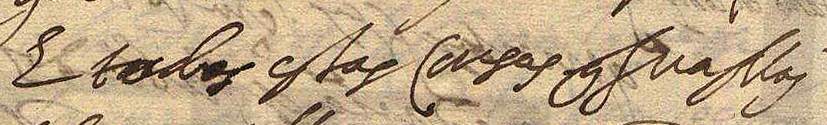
E todas estas Cousas q̄ sua Maj
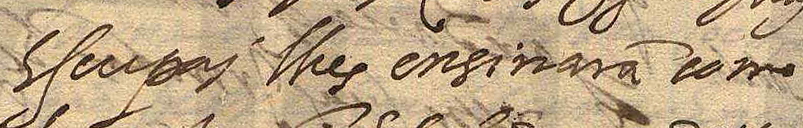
E seu paj lhes ensinarā como
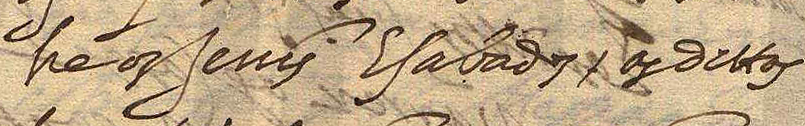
he os Jeiūs E sabados, as dittas
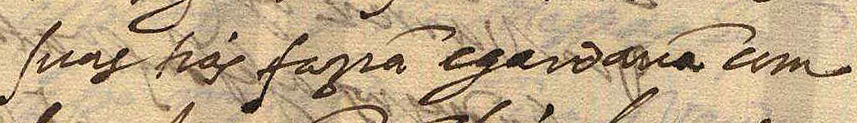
suas tias faziā e gardauā com
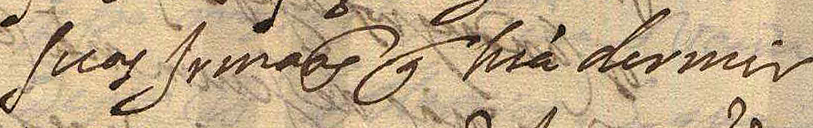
suas Jrmaãs q̄ hiā dormir
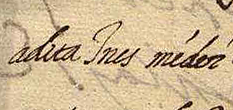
a dita Ines mēdez
